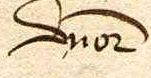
Sn̄or
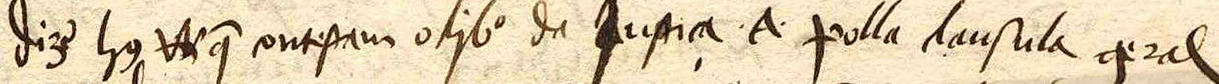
dizē hꝯ RR q̄ contestam o ljbo da Justiça .A. polla clausula geral
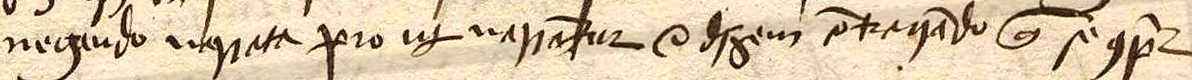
negando narrata pro ut narrātur e djzem c̄otrarjādo q̄ se ꝯp̄r
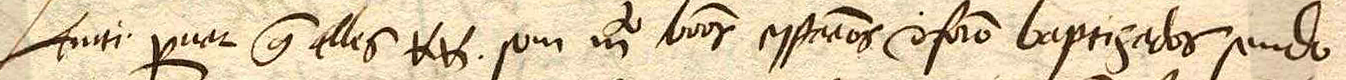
Emti. ꝓuar q̄ elles RR. som mto bōos crjstaãos e forō baptizados sendo
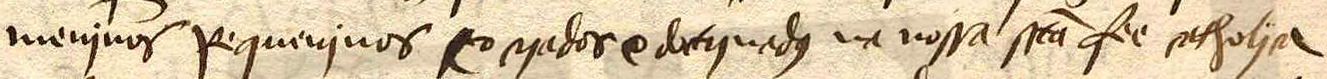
menjnos pequenjnos e crjados e doctrjnadꝯ na nossa sct̄a fee catholjca
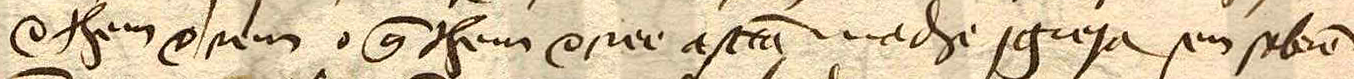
e them e crem o q̄ them e cree a sct̄a madre jgreja sem saberē
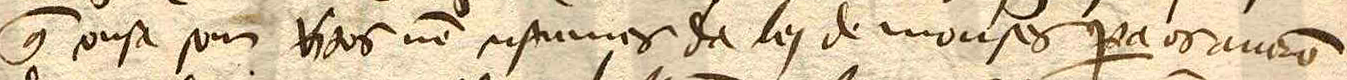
q̄ cousa som Ritos n̄e custumes da lej de mouses ꝑa os auer̄e
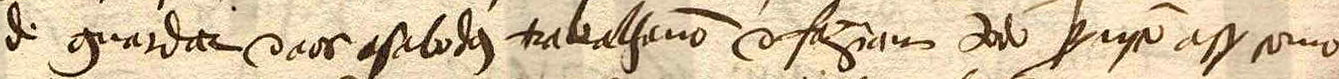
de guardar e aos _sabodꝯ trabalhaūo e faziam todo ꞩujcō asy como
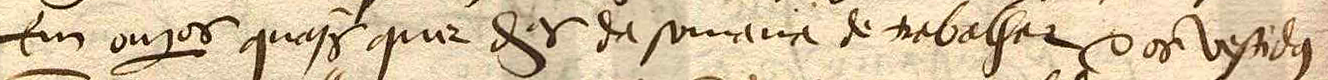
Em outos quajsquer djas da somana de trabalhar e os vestidꝯ
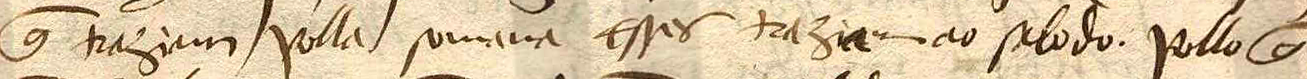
q̄ traziam polla somana Esses traziam ao sabodo. pollo q̄
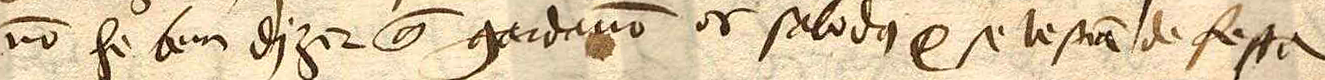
n̄o he bem djzer q̄ gardaūo os sabodꝯ e se vestiā de festa
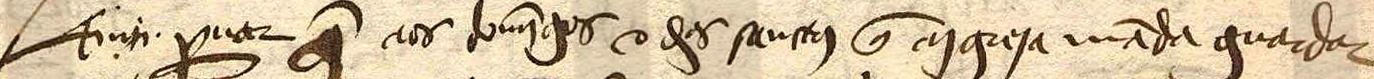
Emti. ꝓuar q̄ aos dom̄jgos e djas sanctꝯ q̄ a jgreja māda guardar
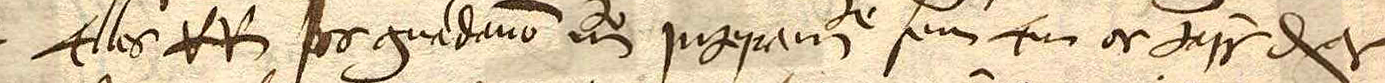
Elles RR os guardaūo mto jntejramte sem Em os tajs djas
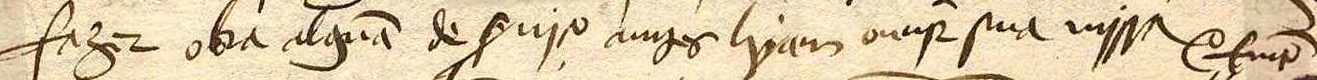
fazer obra algūa de ꞩujço amtes hyam ouujr sua mjssa e Emc̄o
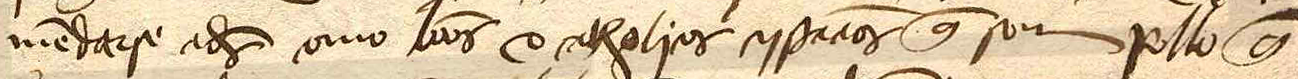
mēdarse a ds̄ como bōos e catholjcos crjstaãos q̄ som pollo q̄
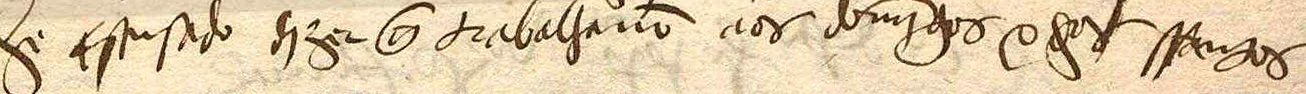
he Escusado djzer q̄ trabalhauō aos dom̄jgos e djas ssantos
